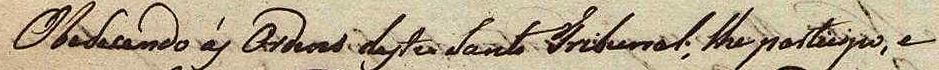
Obedecendo às Ordens deste Santo Tribunal; lhe participo, e
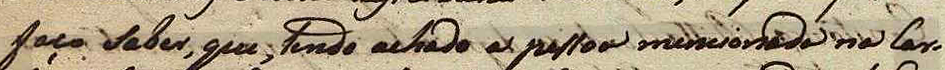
faço saber, que, tendo achado a pessoa mencionada na Car
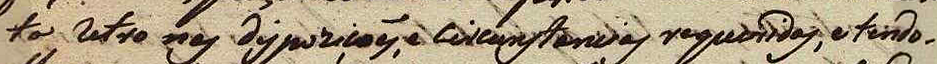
ta Retro nas dispoziçoẽs, e circunstancias requeridas, e tendo
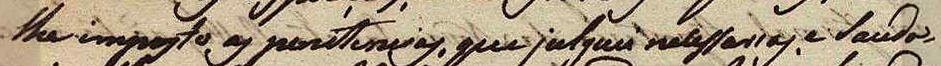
lhe imposto a penitencias, que julguei necessarias, e sauda
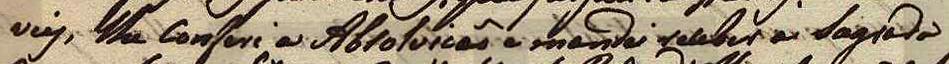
veis, lhe conferi a Absolviçaõ, e mandei receber a Sagrada
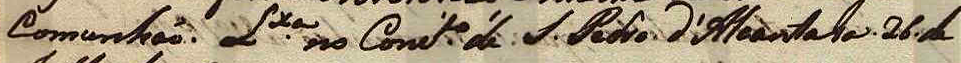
Comunhaõ. L.xa no Convt.o de S. Pedro d'Alcantara .26. de
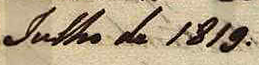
Iulho de 1819.
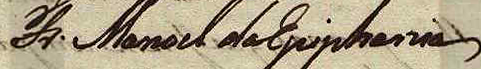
Fr. Manoel da Epiphania
